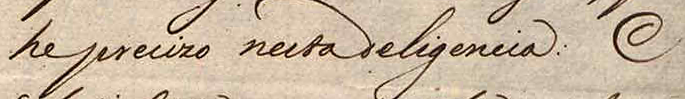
he precizo nesta deligencia: E
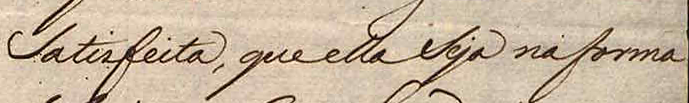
Satisfeita, que ella Seja na forma
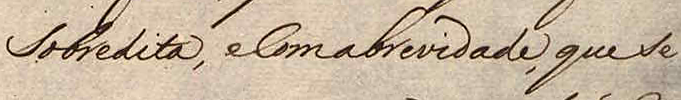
Sobredita, e Com a brevidade, que se
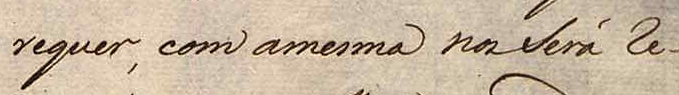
requer, com a mesma noz Será Re
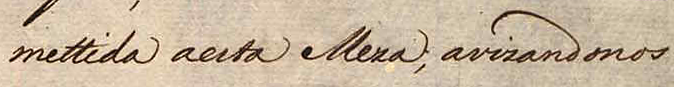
mettida a esta Meza, avizandonos
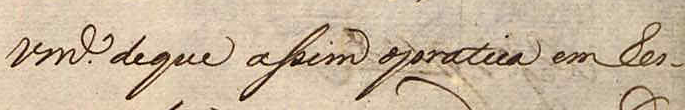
vm.ce de que assim o pratica em Res
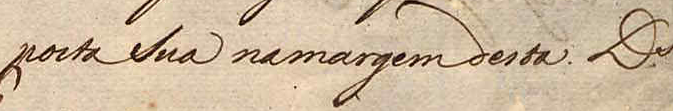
posta Sua na margem desta. D.s
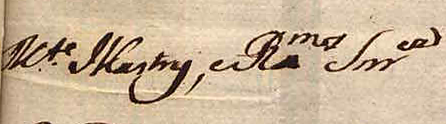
M.to Illustres, e R.mos Snr.es
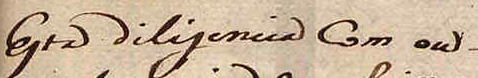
Esta diligencia Com ou
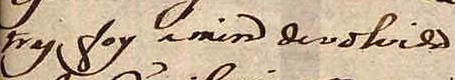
tras foy a mim devolvida
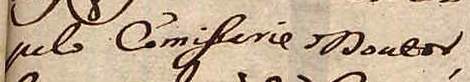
pelo Com̄issario o Doutor
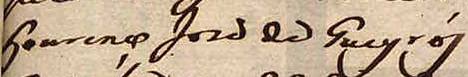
Lourenço Jozé de Queyrós
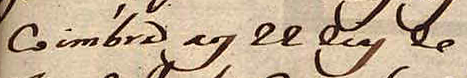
Coimbra aos 22 dias de
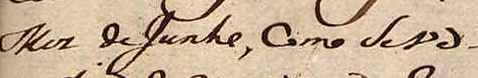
Mez de Junho, Como se ve
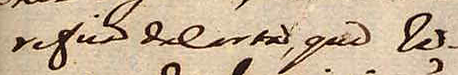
refica da Carta, que Re
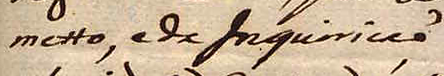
metto, e da Jnquiriçaõ
